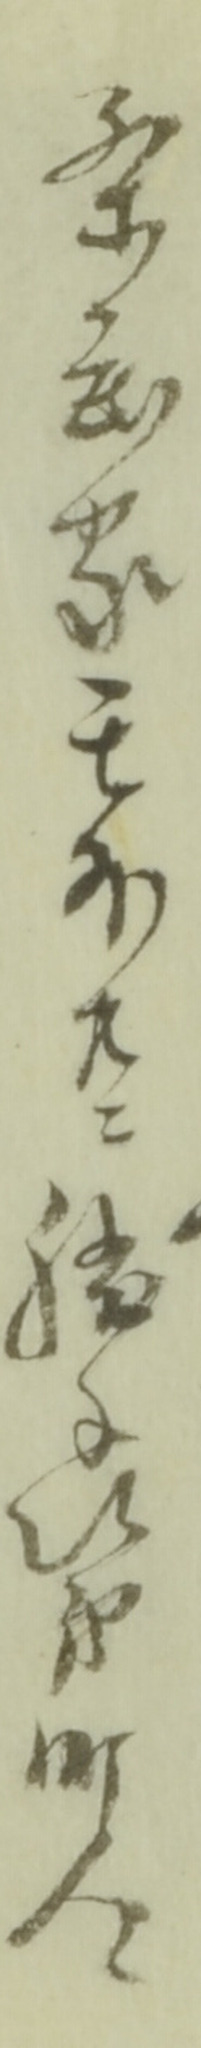条茂家其外共二勝手次第町人二
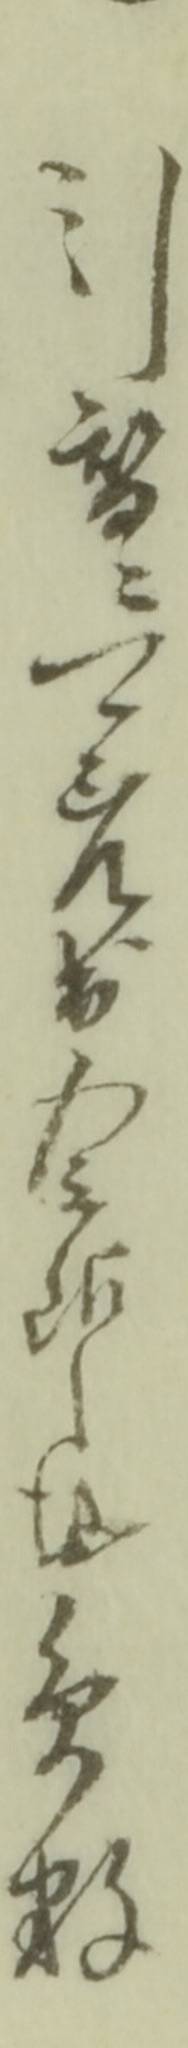一引替二可差出金銀之儀員数
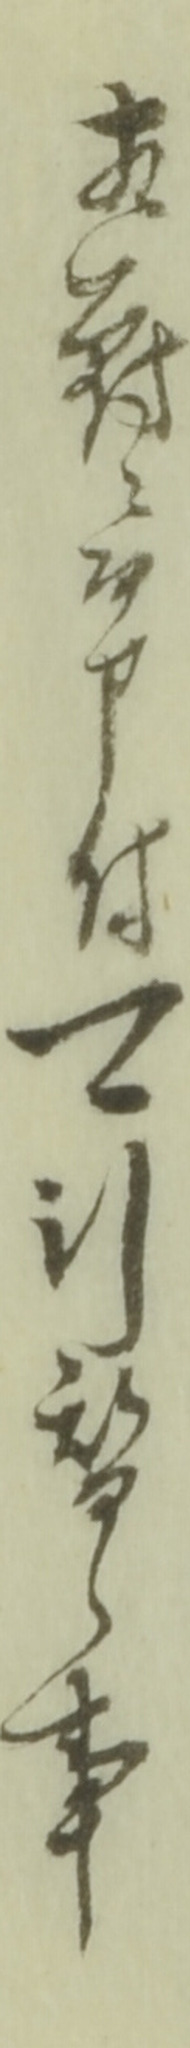相対二而申付可引替候事
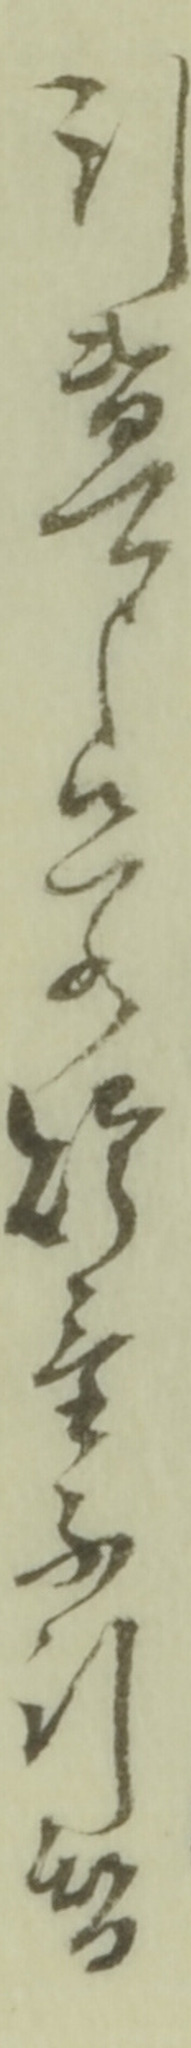引替可申候若貯置不引替
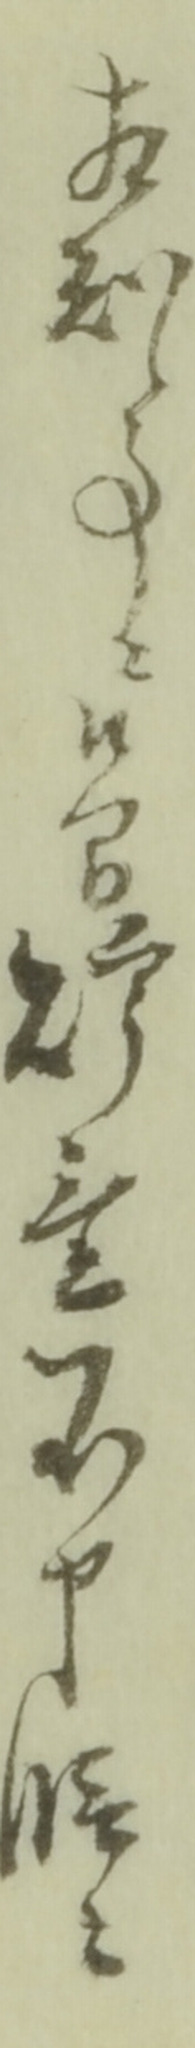相知候事二候間貯置不申段二
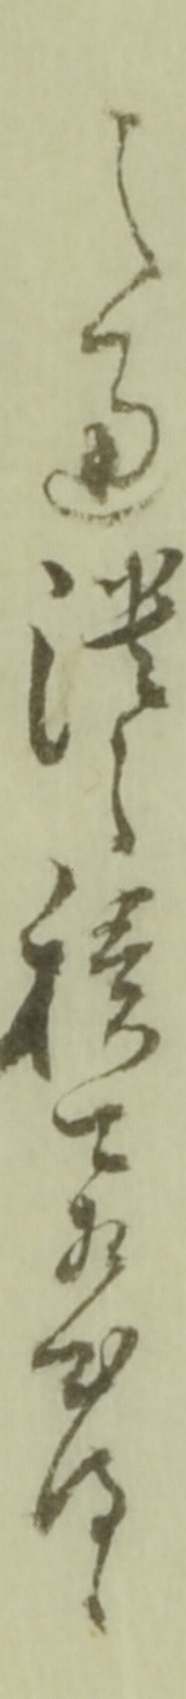之通潰し積可相心得候
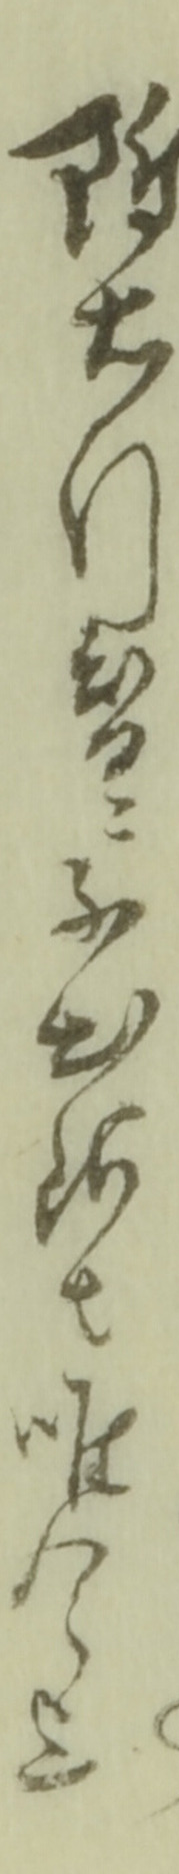附右疋替二不出銀者只今迄
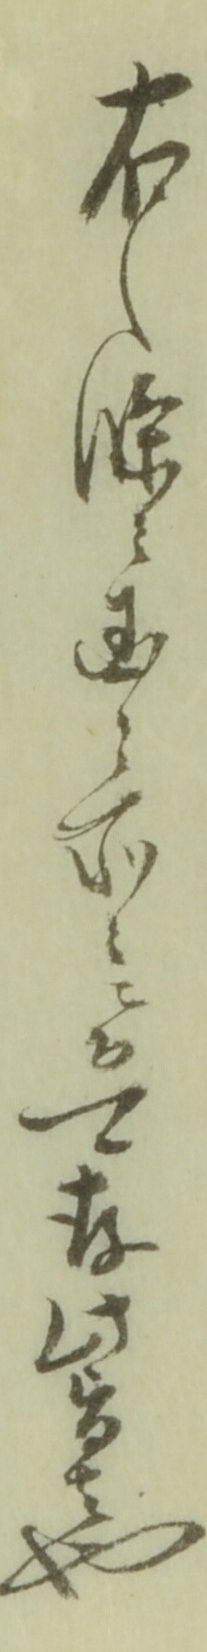右之條国々所々二而可存此旨者也
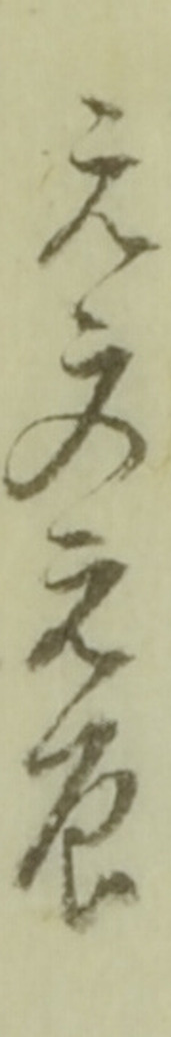元文元年
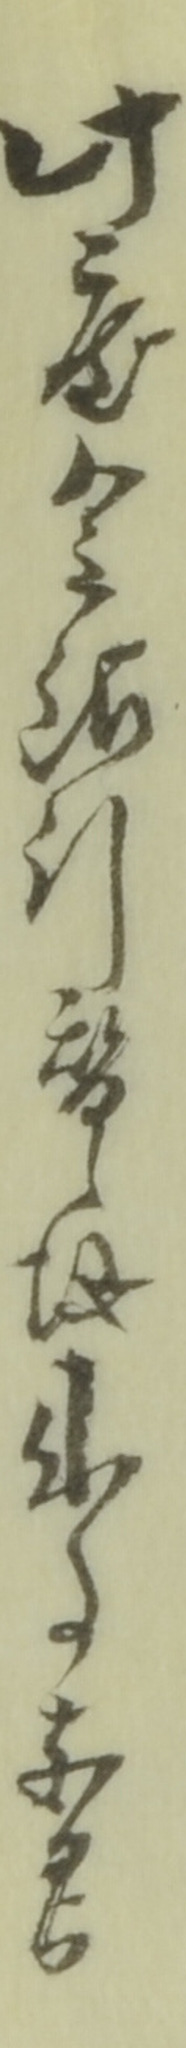此度金銀引替之儀来るより
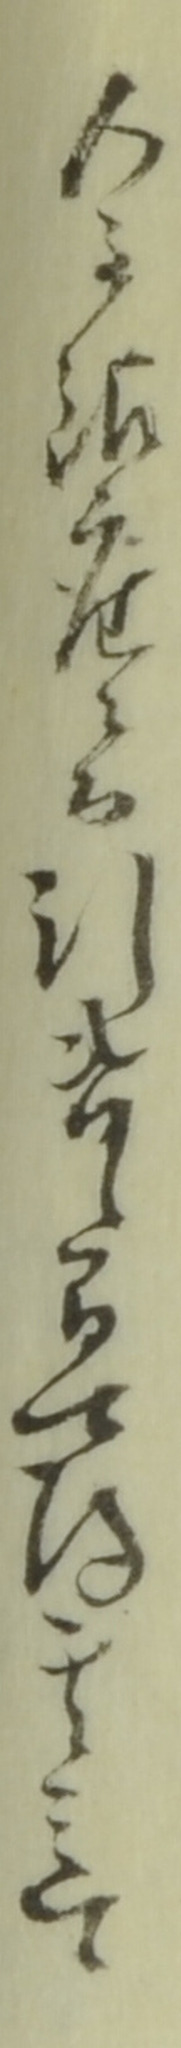金銀座二而引候間可得其意候

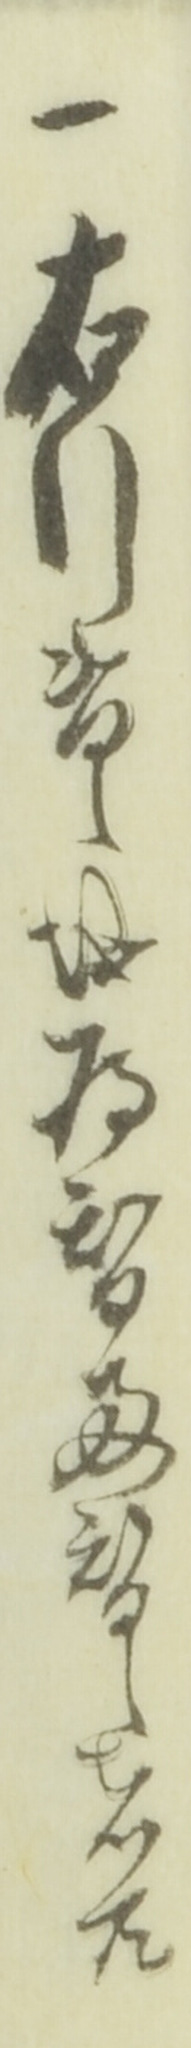一右引替之儀為替両替候者共
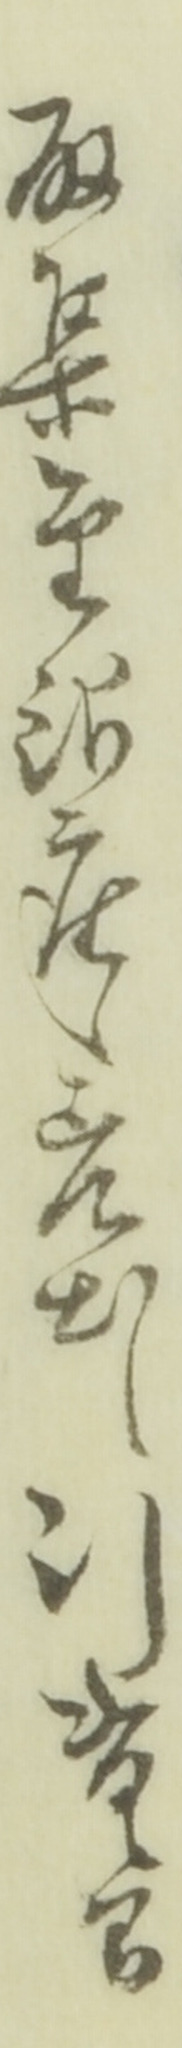集金銀座之差出候引替候間
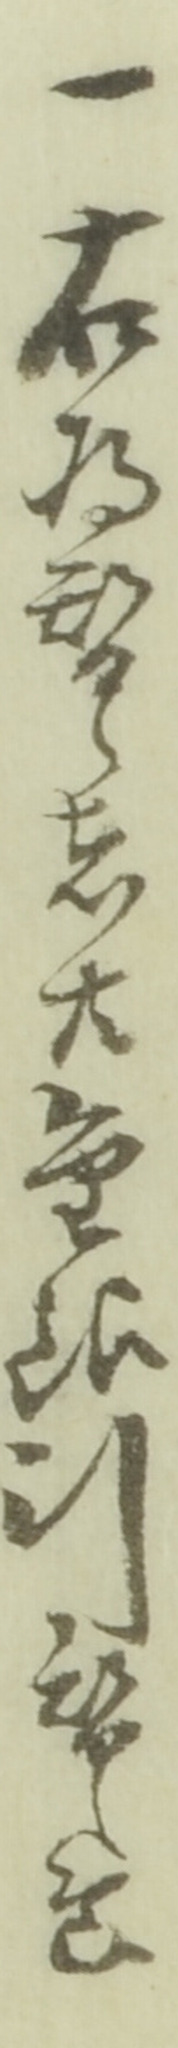一右為替候者大金銀引替候雖
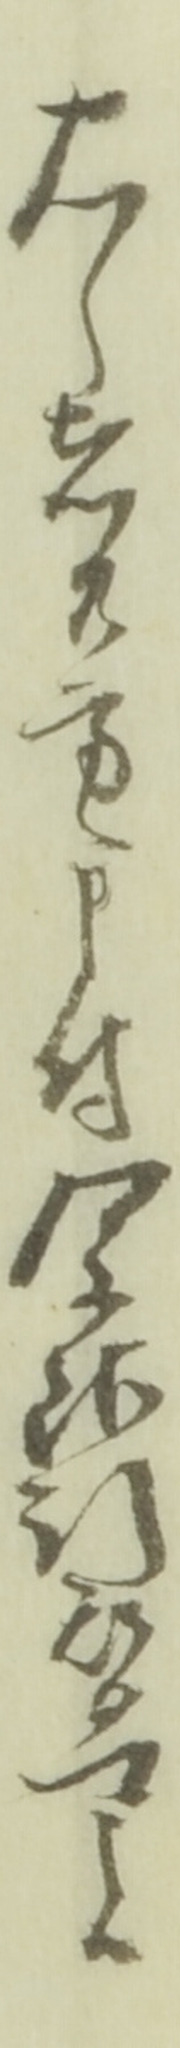右之者共方へ申付け金銀引替可申候
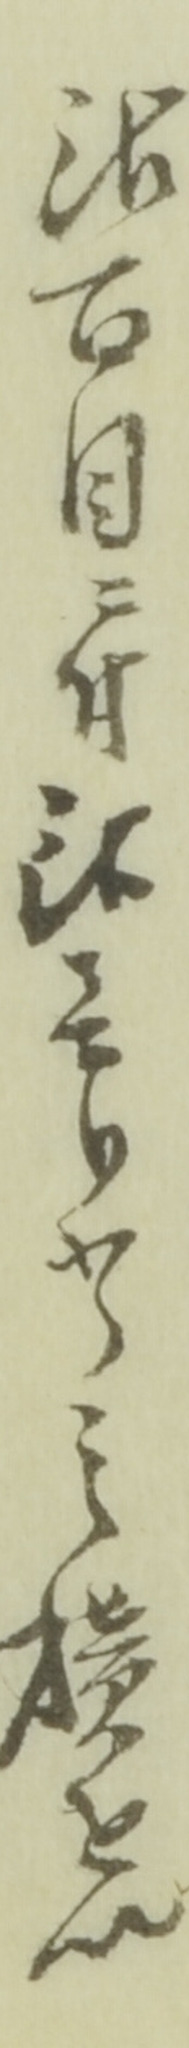銀百目二付銀壱百少々之積を以
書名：御公儀様御領主様御触書控
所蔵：伊那市立高遠町図書館・合同会社AMANE
